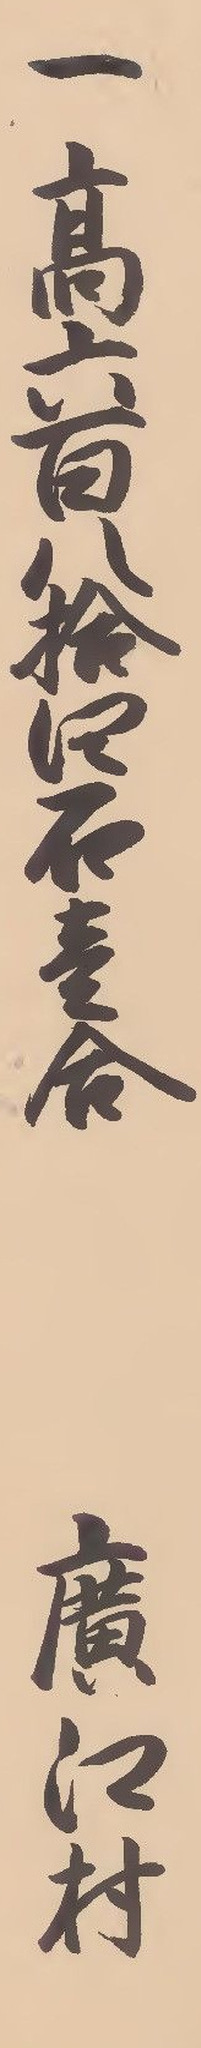一高六百八拾四石壱合広江村

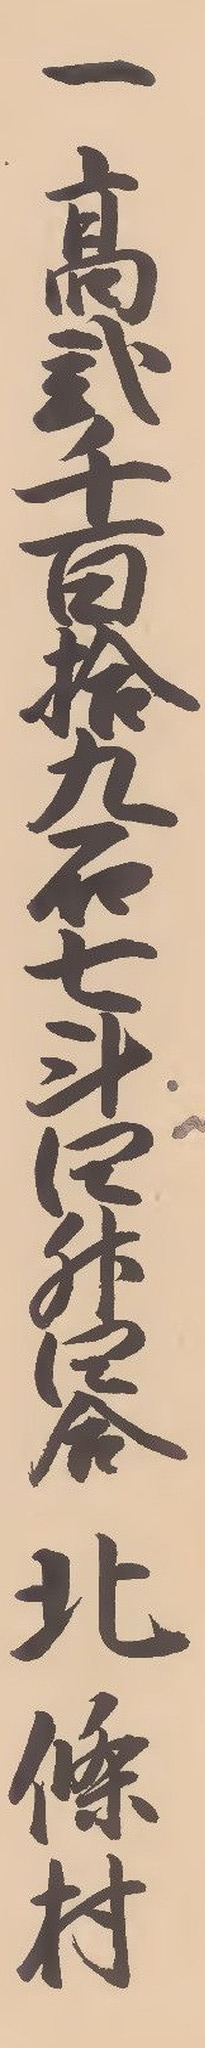一高弐千百拾九石七斗四升四合北条村
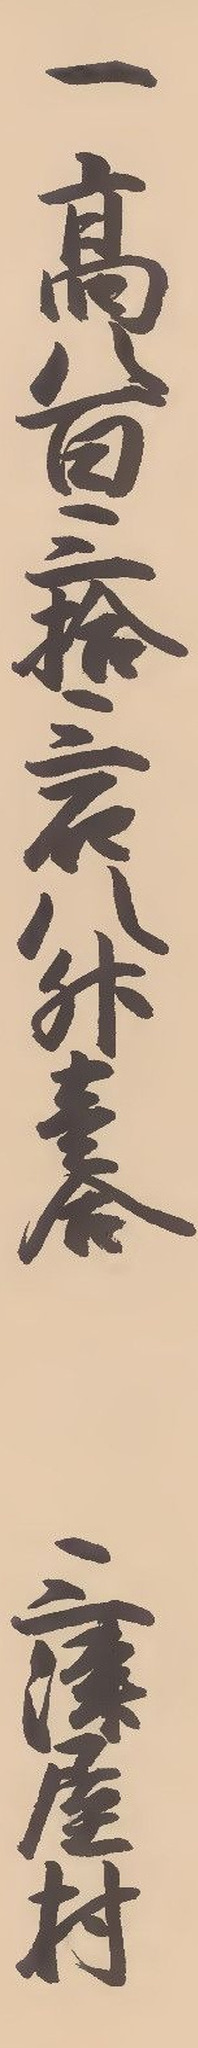一高八百三拾三石八升壱合三津屋村
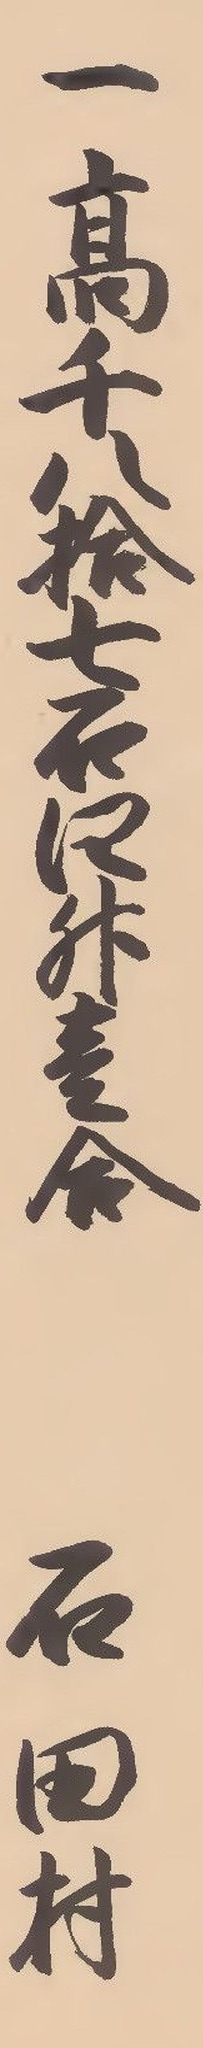一高千八拾七石四升壱合石田村
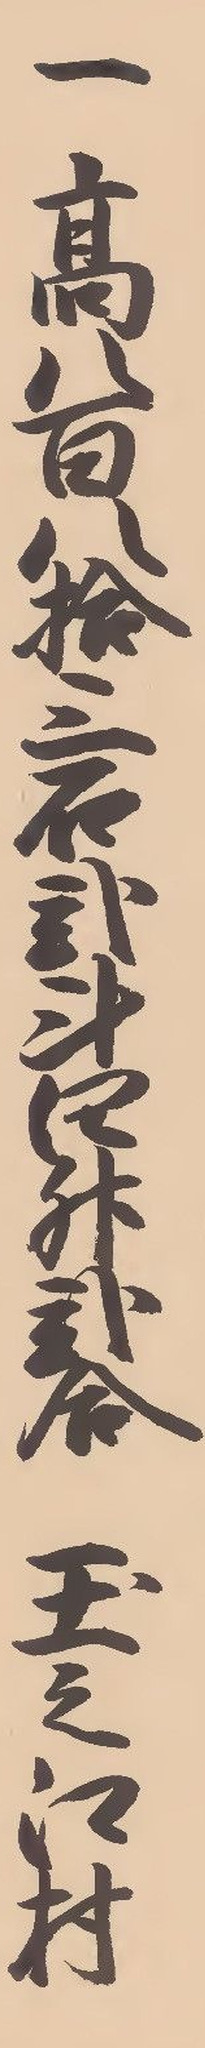一高八百八拾三石弐斗四升弐合玉之江村
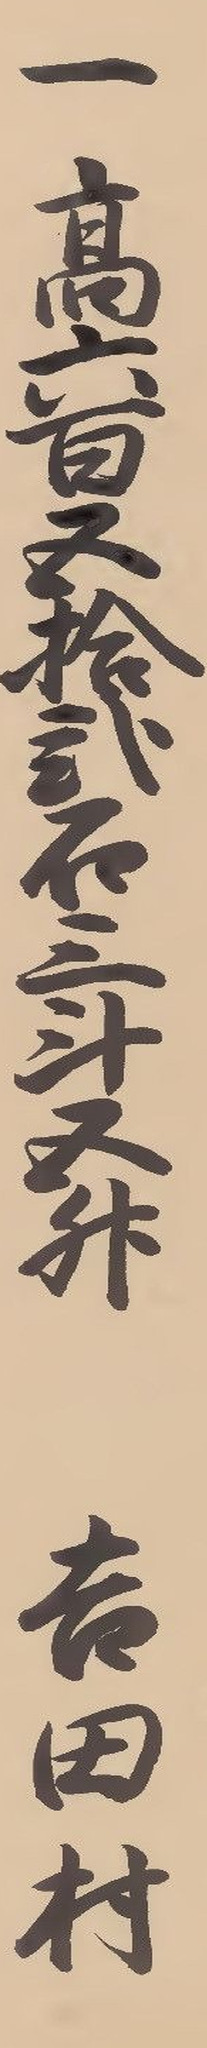一高六百五拾弐石三斗五升吉田村
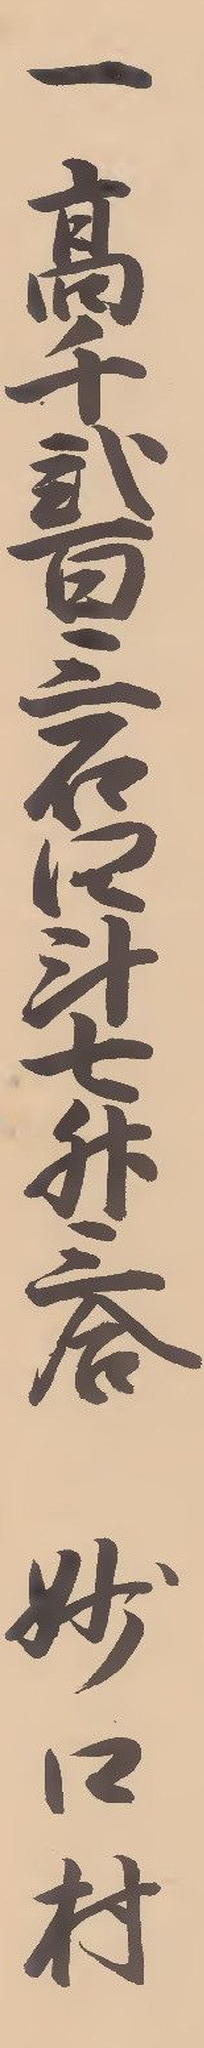一高千弐百三石四斗七升三合妙口村

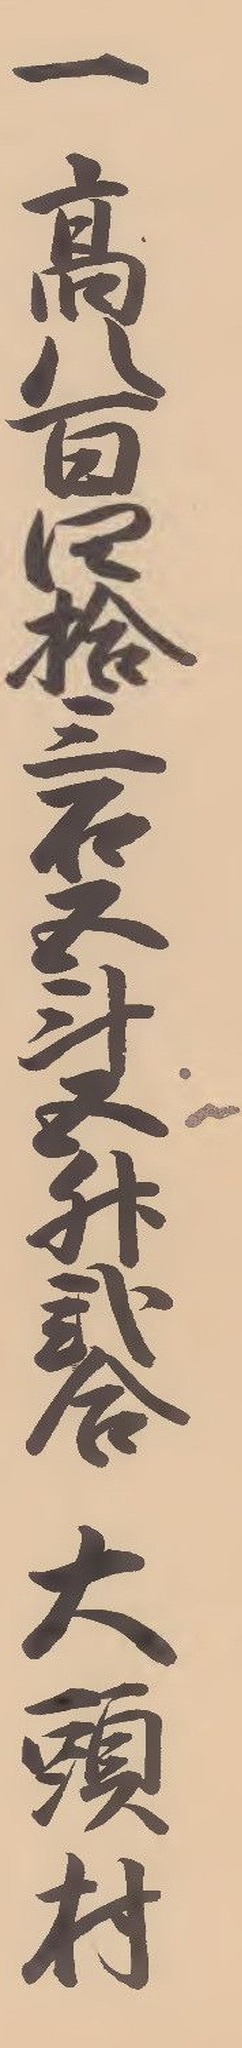一高八百四拾三石五斗五升弐合大頭村
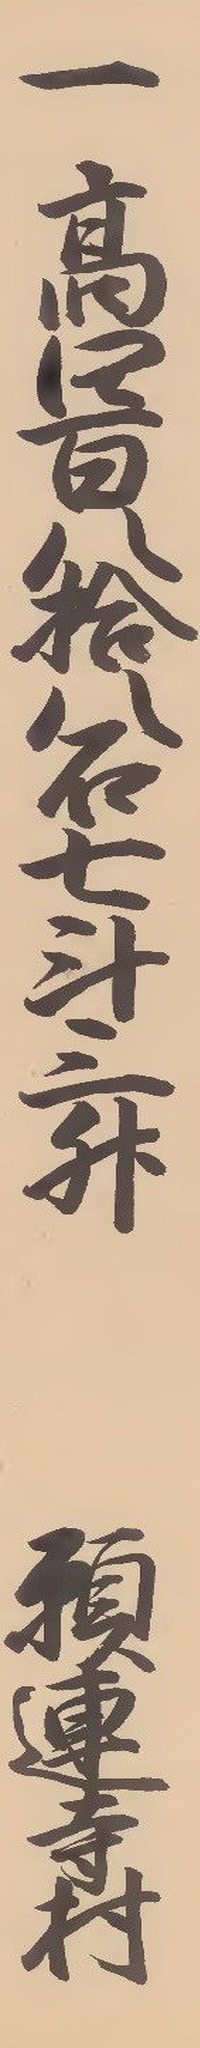一高四百八拾八石七斗三升願連寺村
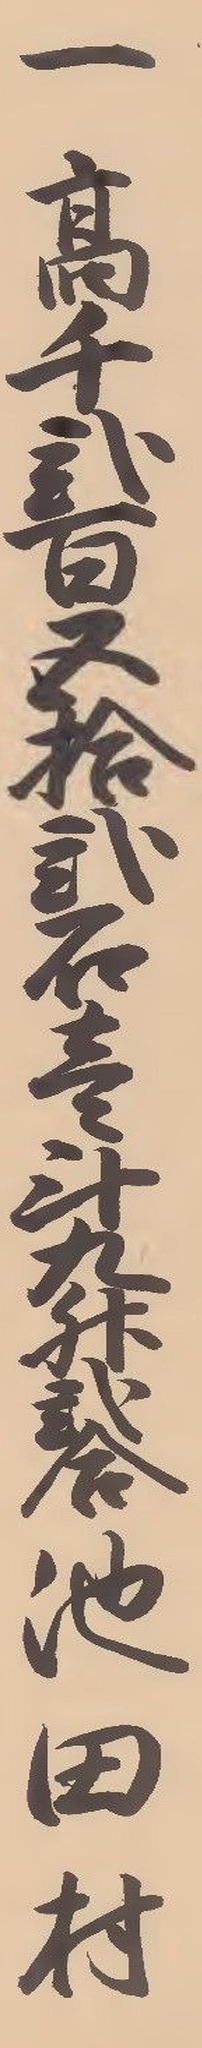一高千弐百五拾弐石壱斗九升弐合池田村
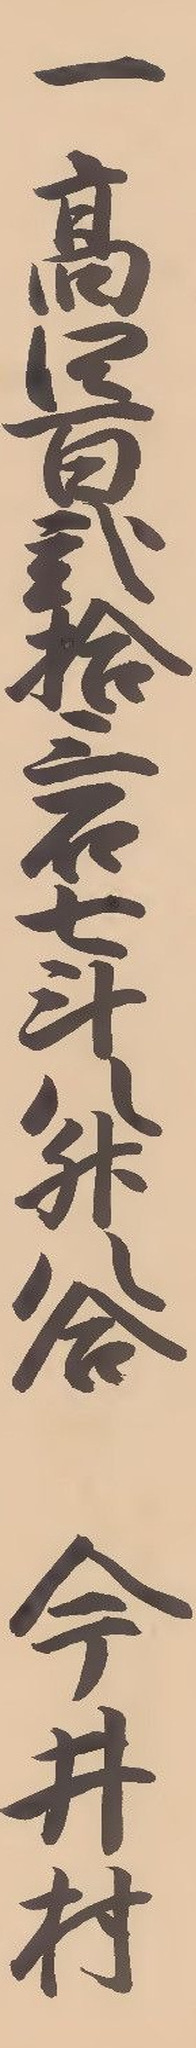一高四百弐拾三石七斗八升八合今井村
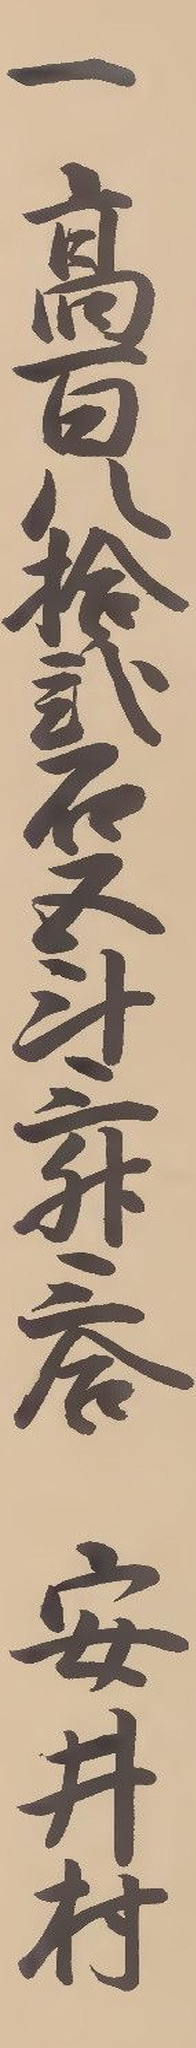一高百八拾弐石五斗三升三合安井村
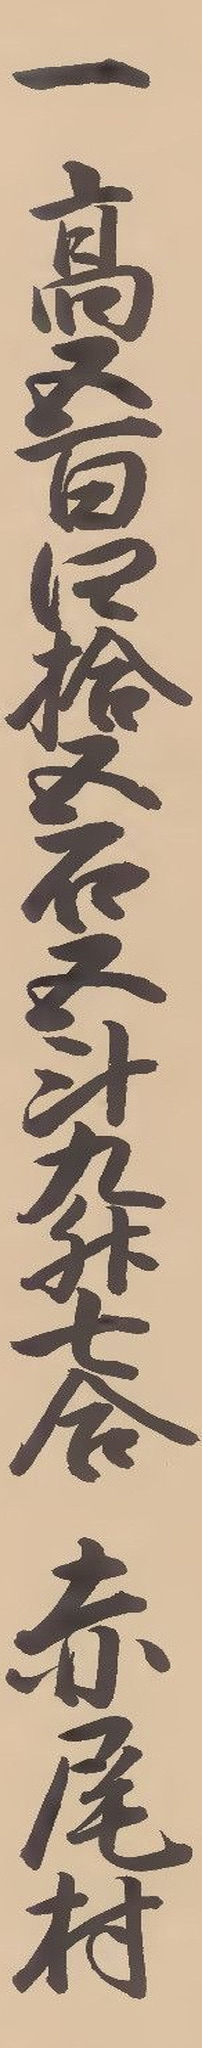一高五百四拾五石五斗九升七合赤尾村
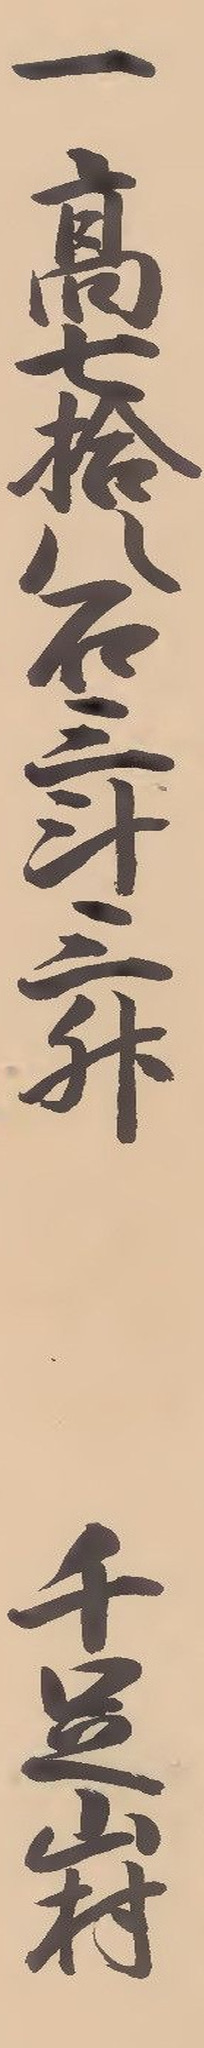一高七拾八石三斗三升千足山村

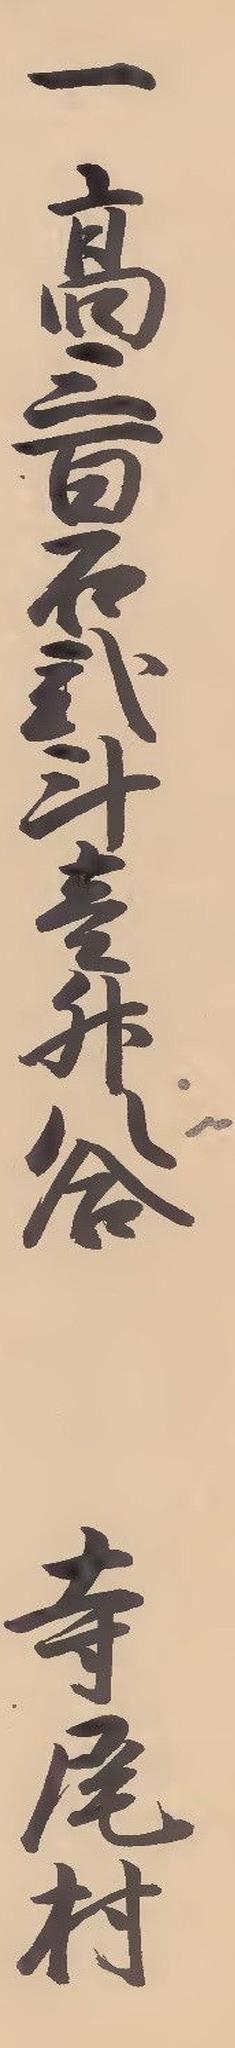一高三百石弐斗壱升八合寺尾村
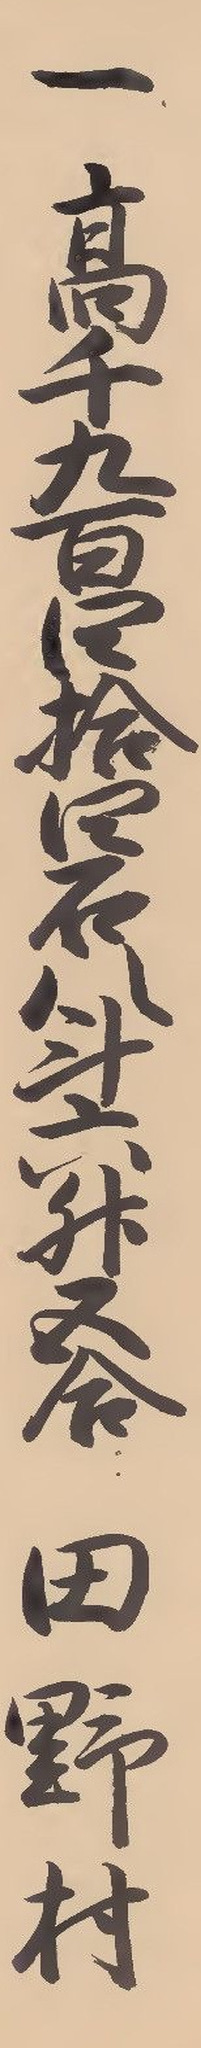一高千九百四拾四石八斗六升五合田野村
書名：伊予国郷帳
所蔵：国立公文書館 National Archives of Japan
